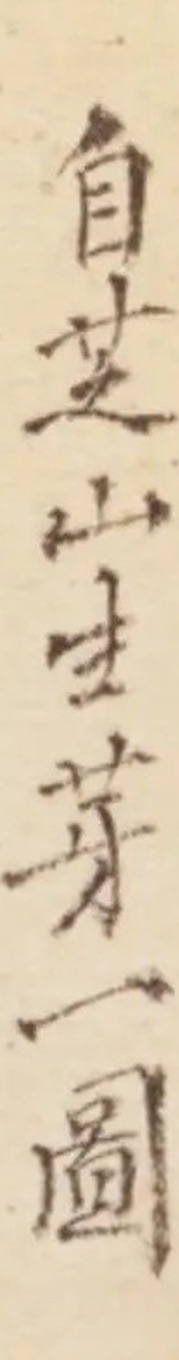自芝山生芽一圖
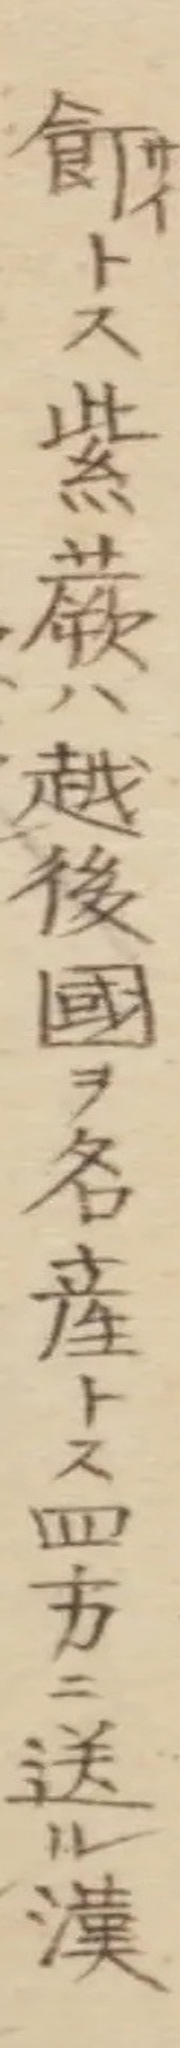飣とす紫蕨は越後國を名産とす四方に送る漢

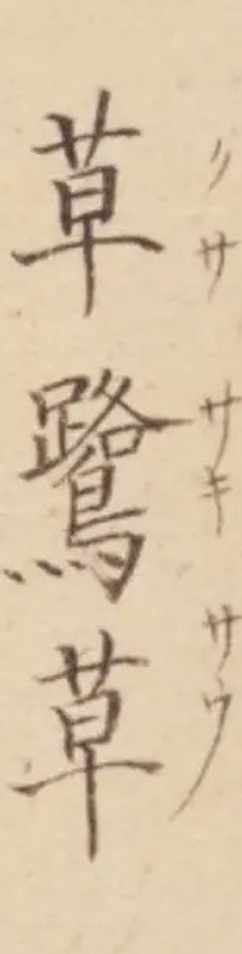草鷺草
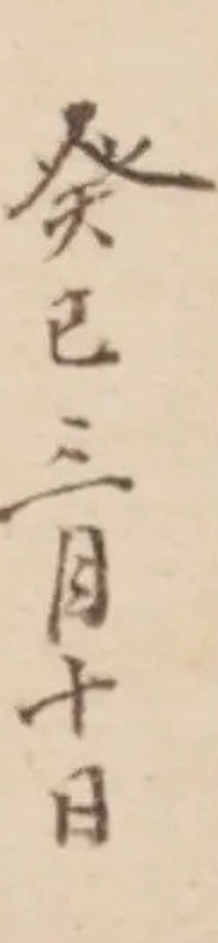癸巳三月十日
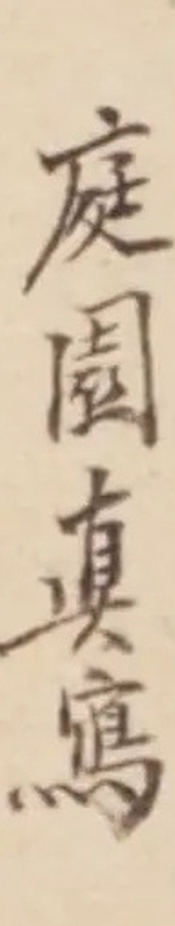庭園真寫
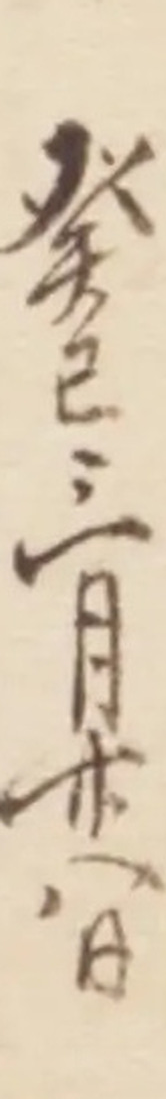癸巳三月廿八日
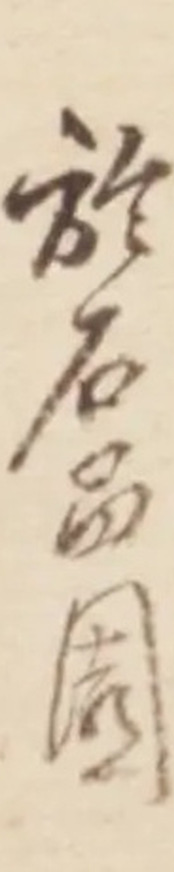於石叧園

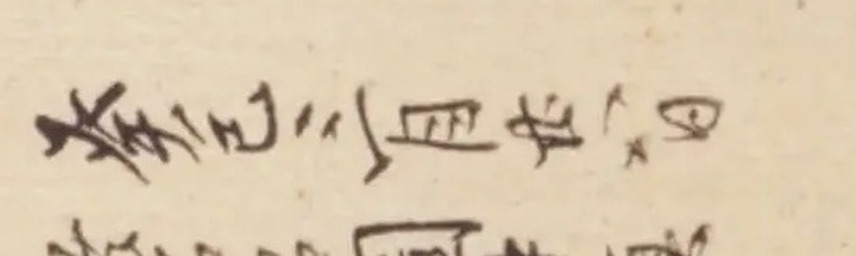癸巳三月廿八日
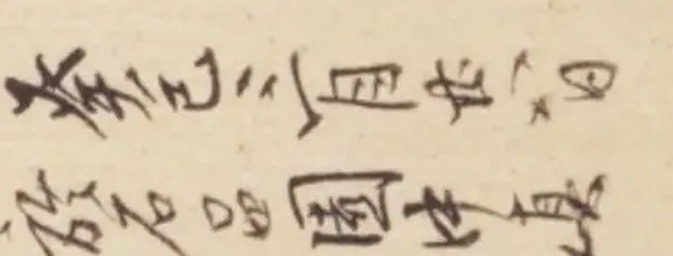癸巳三月廿八日
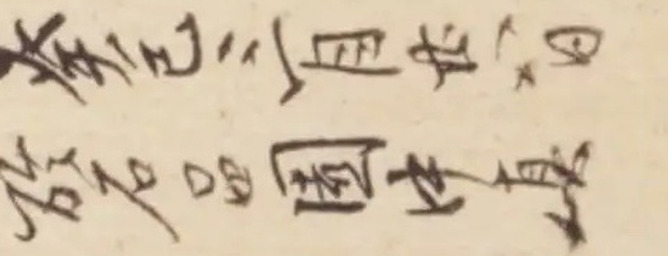於石品園中真
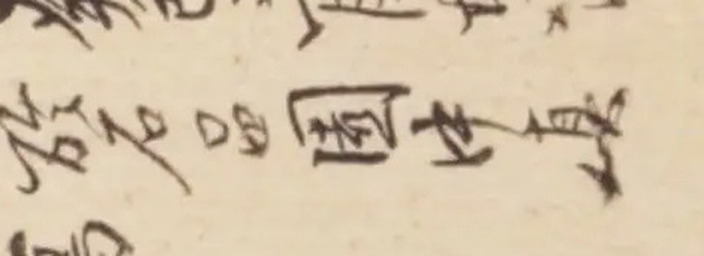於石品園中真
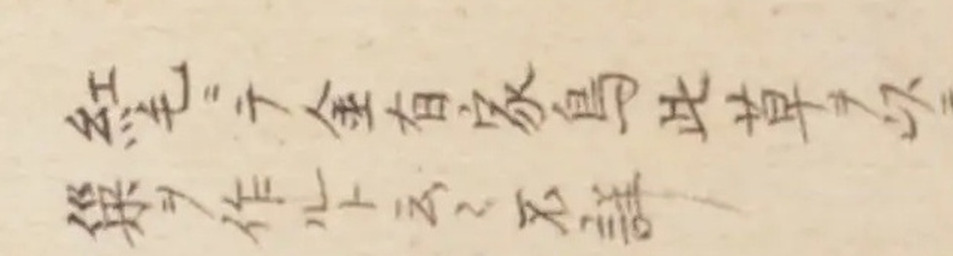紅毛ニテ金有家鳥此草ヲ以テ

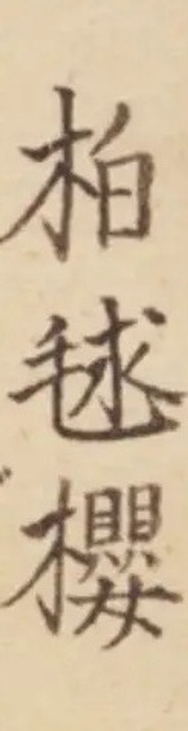柏毬櫻
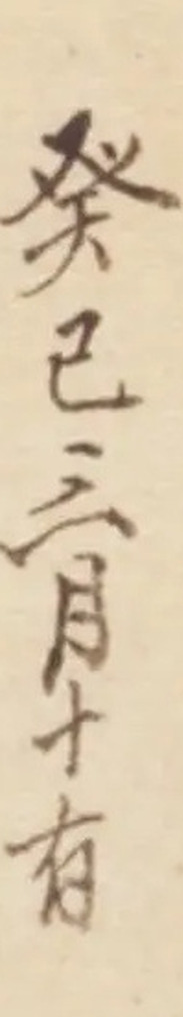癸巳三月十有
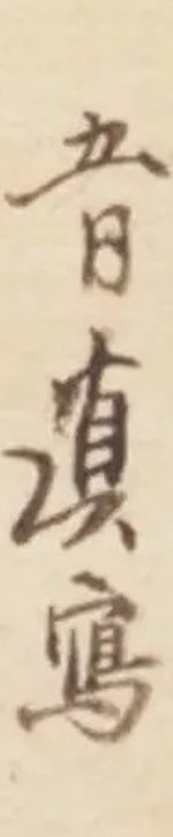五日真寫

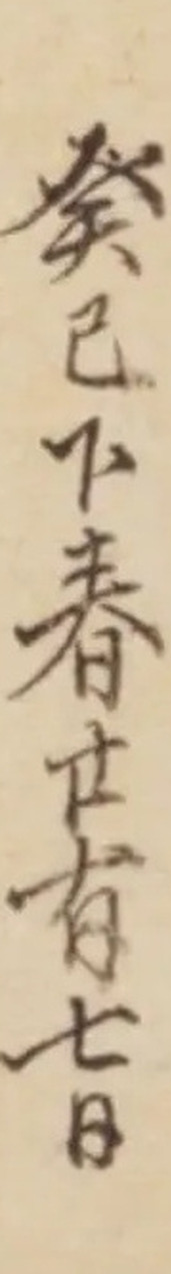癸巳下春廿有七日
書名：梅園草木花譜春之部. 4
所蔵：国立国会図書館 National Diet Library, JAPAN
